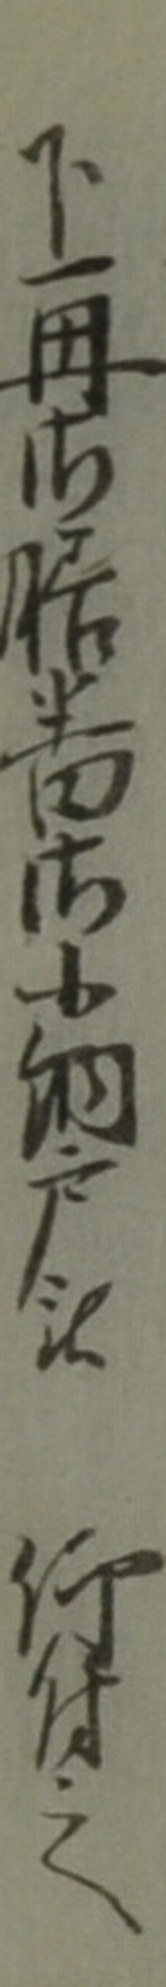下再御膳番御小納戸被仰付之
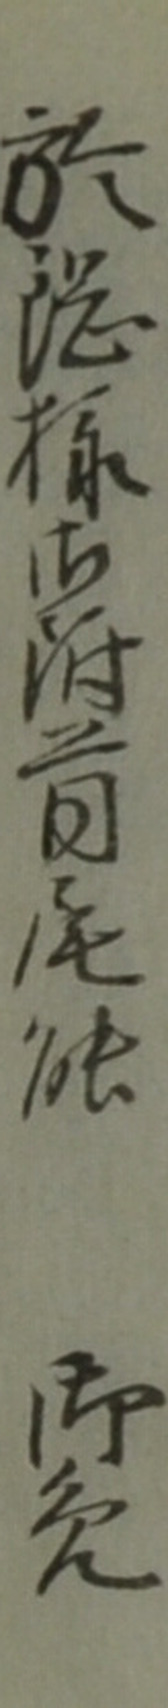於綱様御附首尾能御免
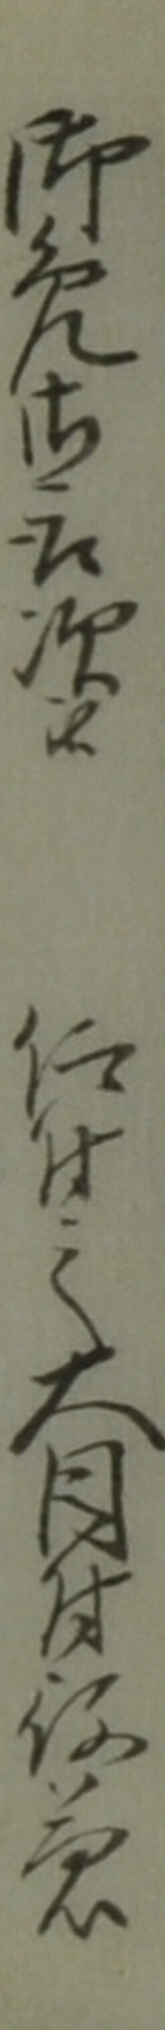御免御取次被仰付之大目付役兼
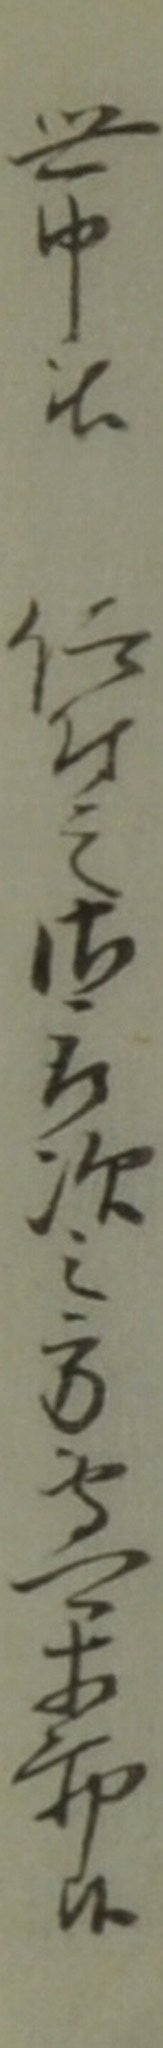帯被仰付之御取次之方専可相勤候

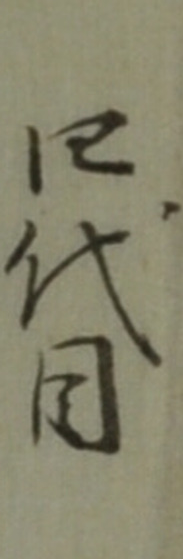四代目
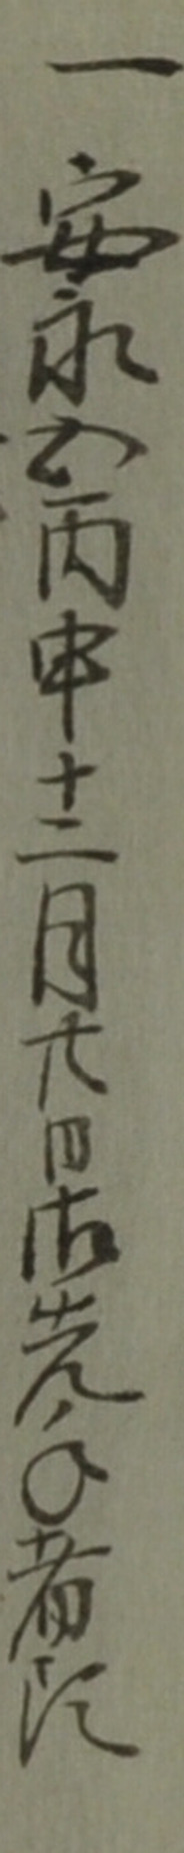一安永五丙申十二月廿日御先手者頭
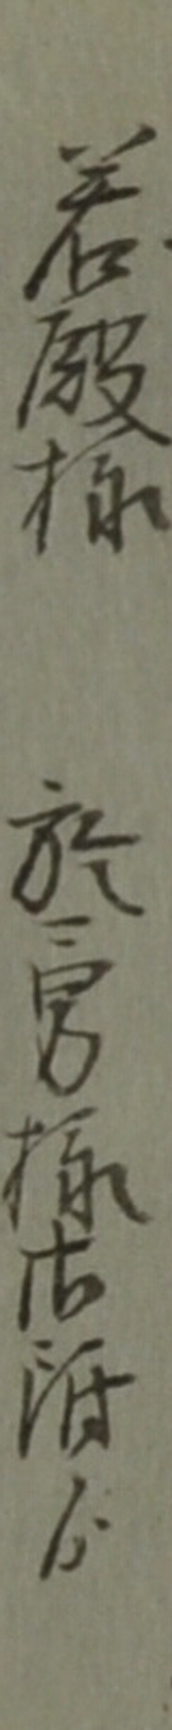若殿様於勇様御附ゟ
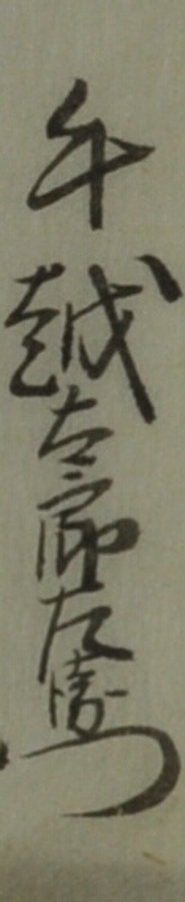牛越太郎左衛門
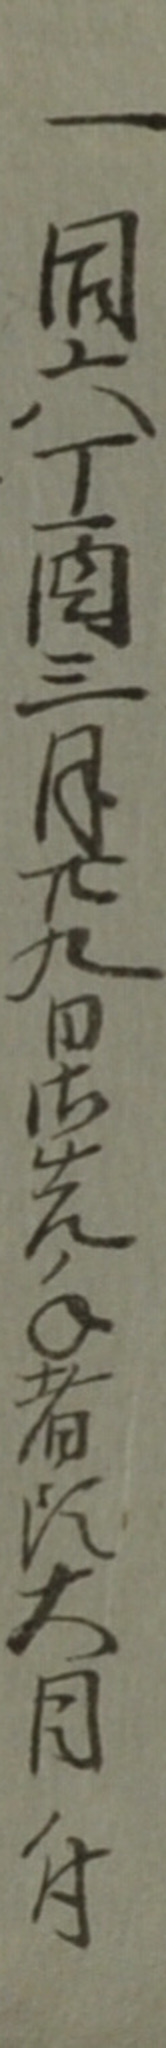一同六丁酉三月廿九日御先手者頭大目付
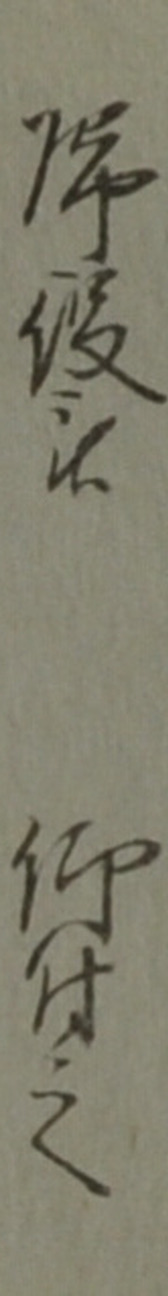帰役仰付之
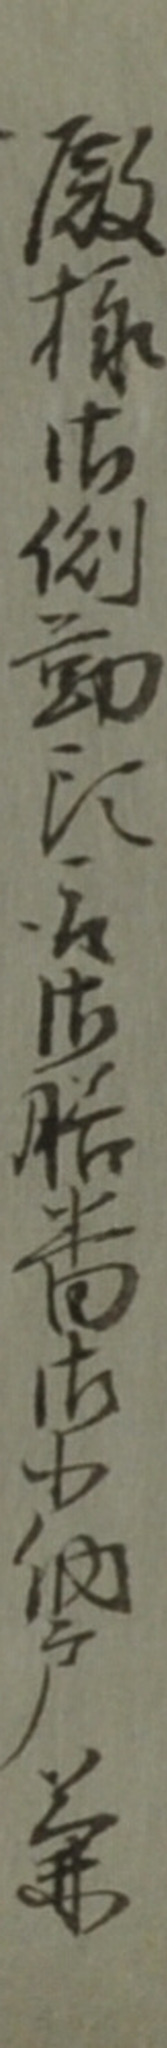殿様御側勤頭取御膳番御小納戸兼
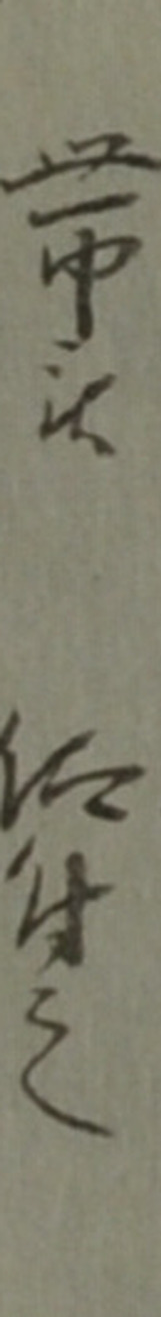帯被仰付之
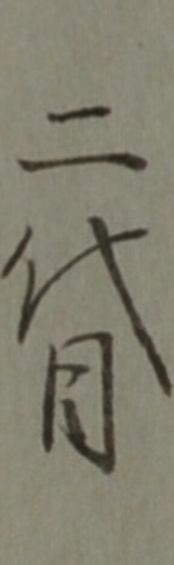二代目
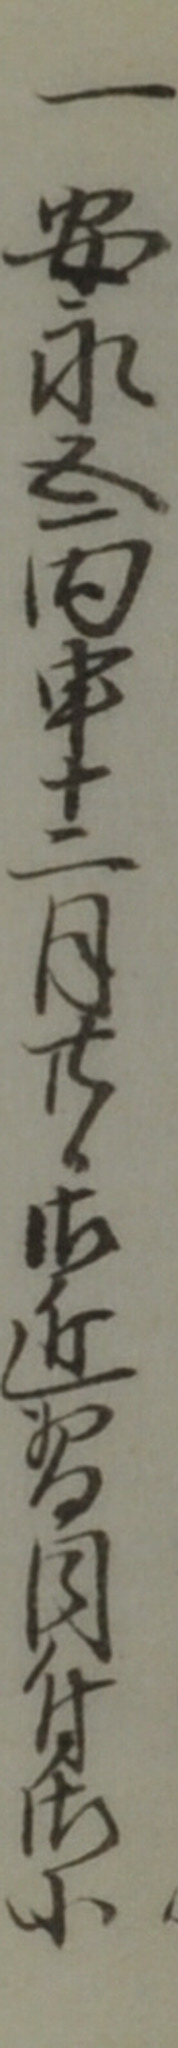一安永五丙申十二月廿日御近習目付御小
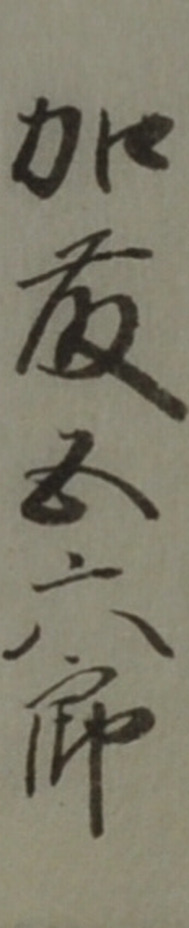加藤五六郎
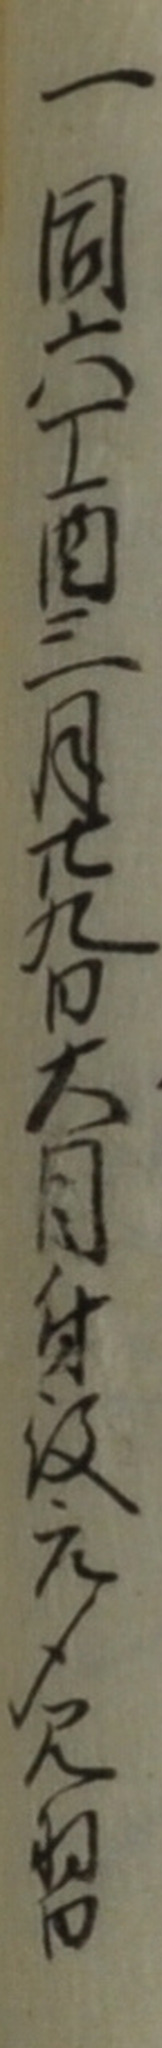一度六丁酉三月廿九日大目付役元〆見習
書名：諸御役代々録（四）
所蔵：伊那市立高遠町図書館・合同会社AMANE
